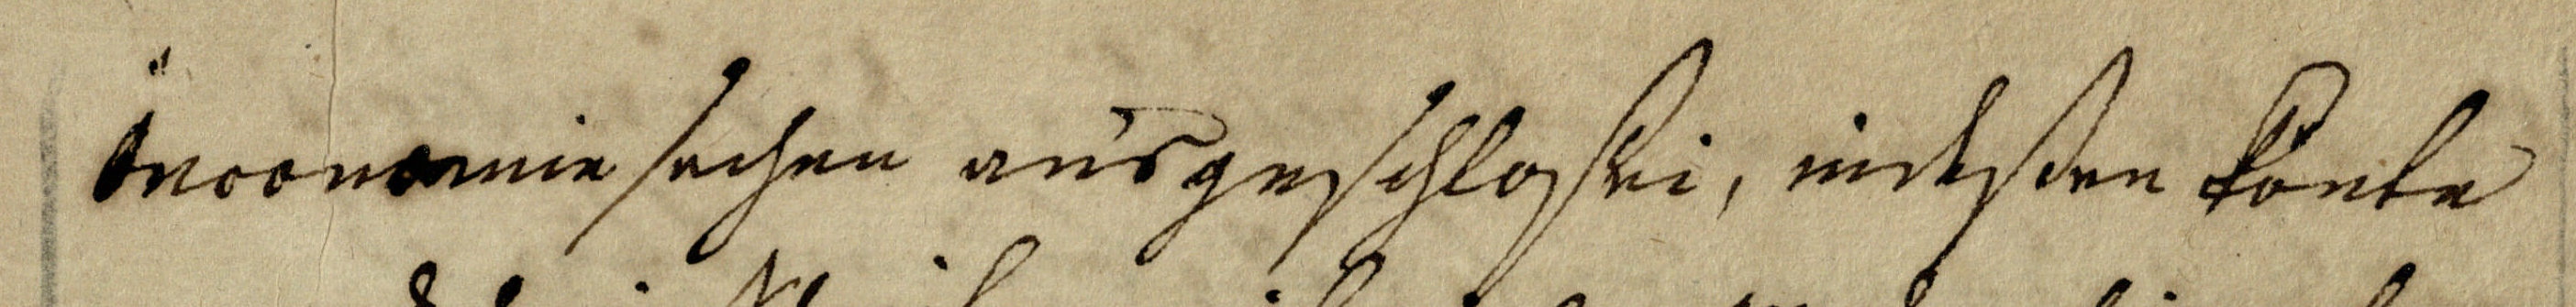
Oeconomie sachen ausgeschloßen, indeßen könte
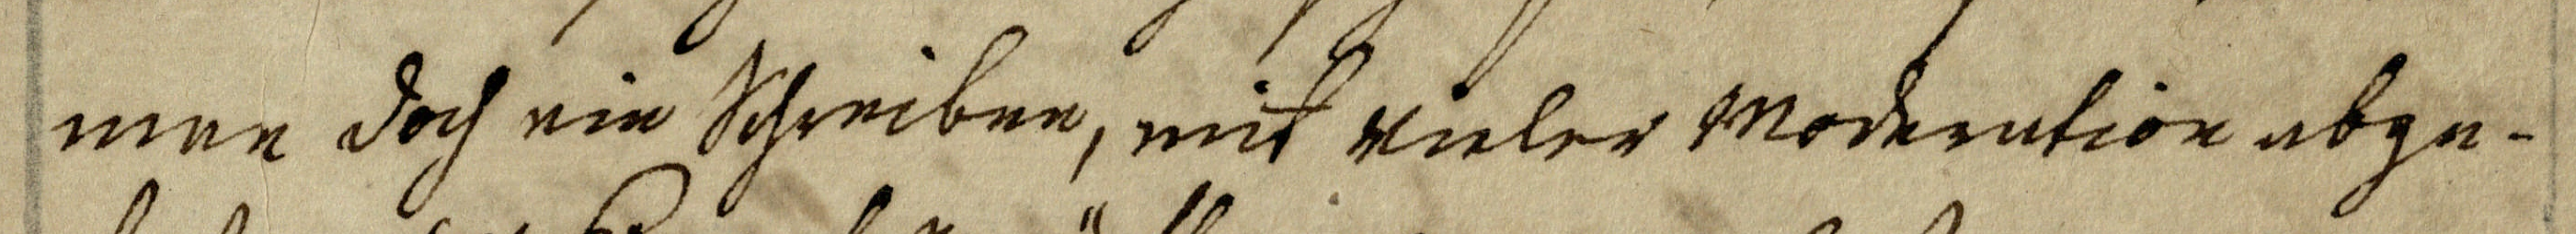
man doch ein Schreiben, mit vieler Moderation abge¬
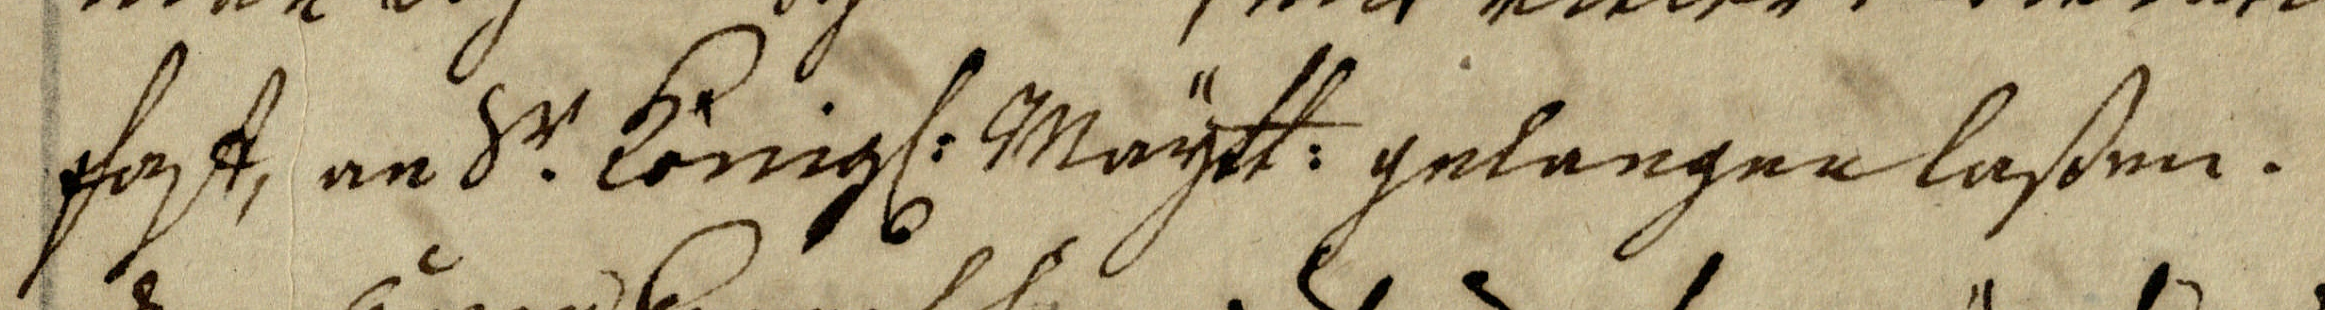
fast, an Sr. Königl. Maÿtt. gelangen laßen.
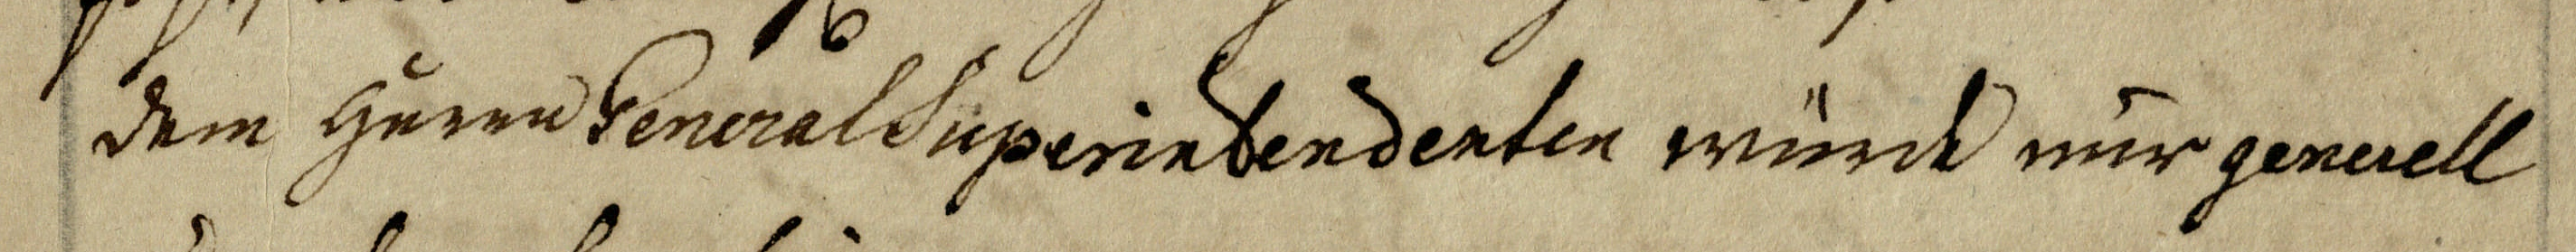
dem Herrn GeneralSuperintendenten würde nur generell
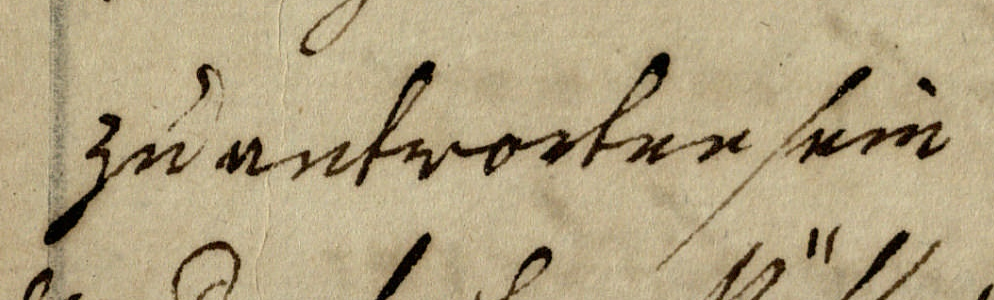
zu antworten sein.
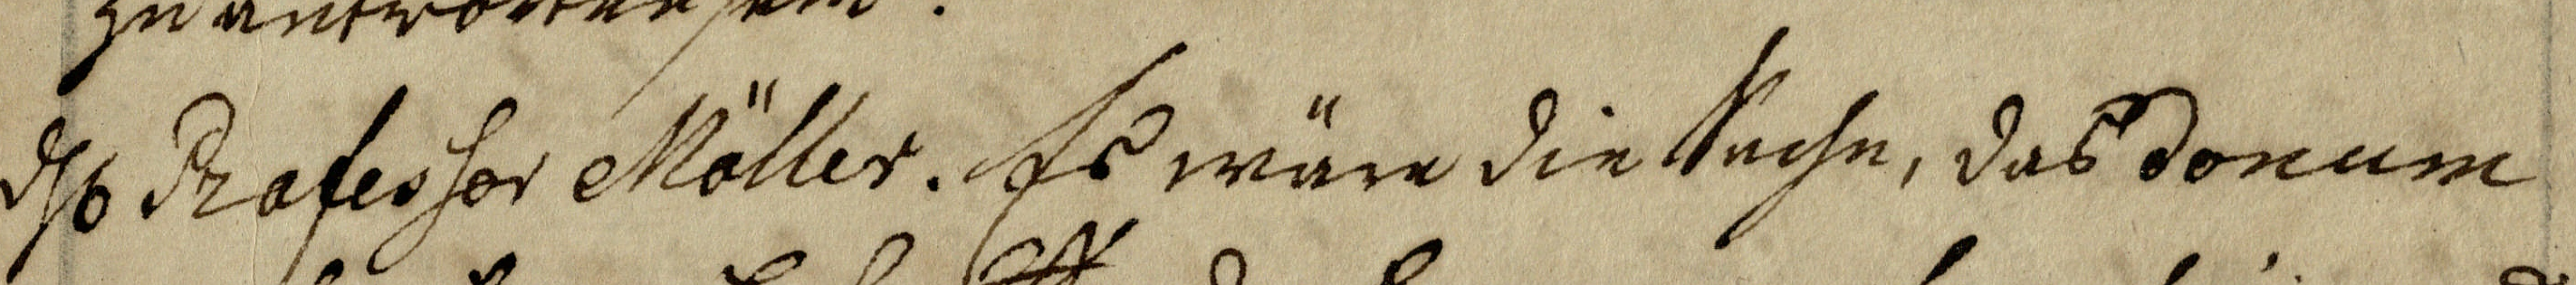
dh Professor Möller. Es wäre die Sache, das donum
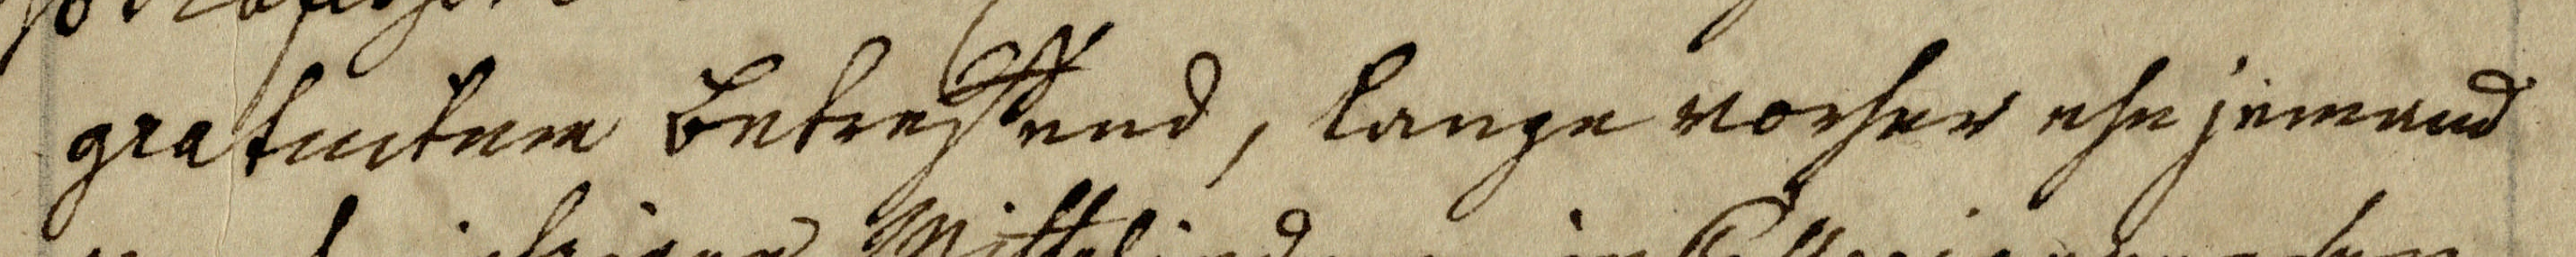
gratuitum betreffend, lange vorher ehe jemand
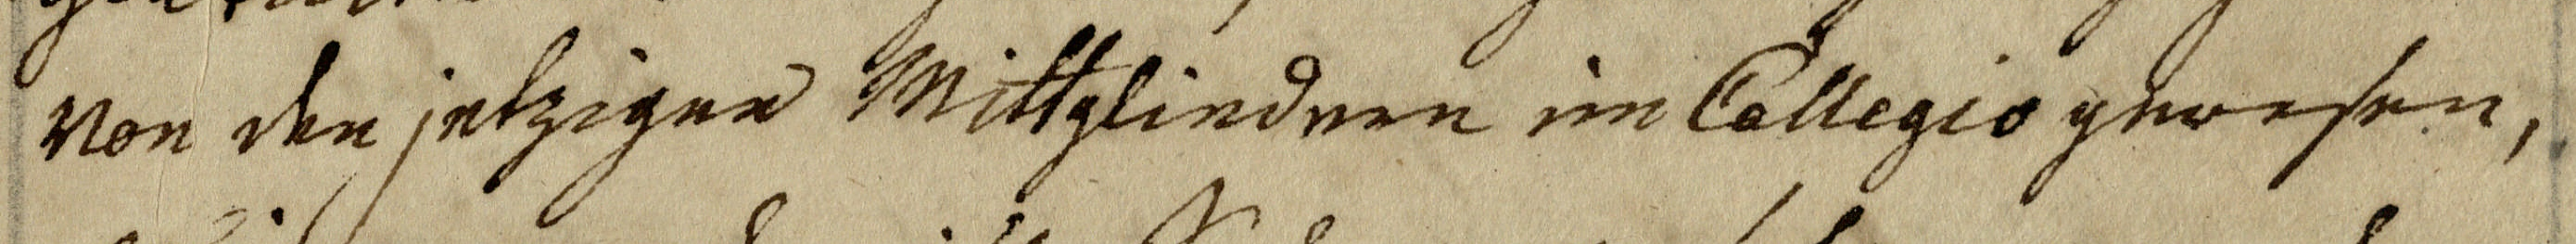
von den jetzigen Mittgliedern im Collegio gewesen,
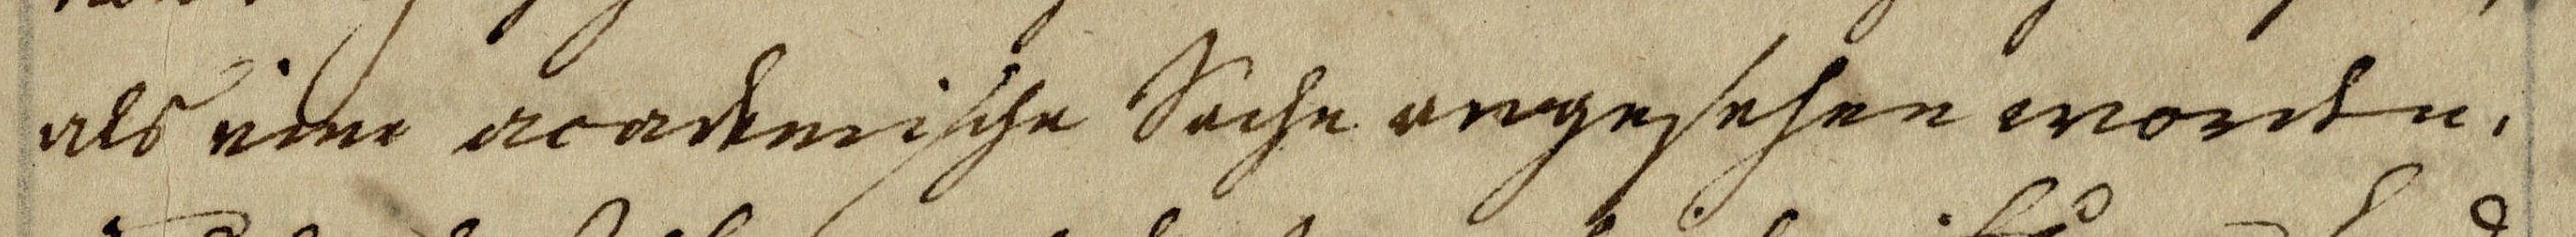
als eine academische Sache angesehen worden,
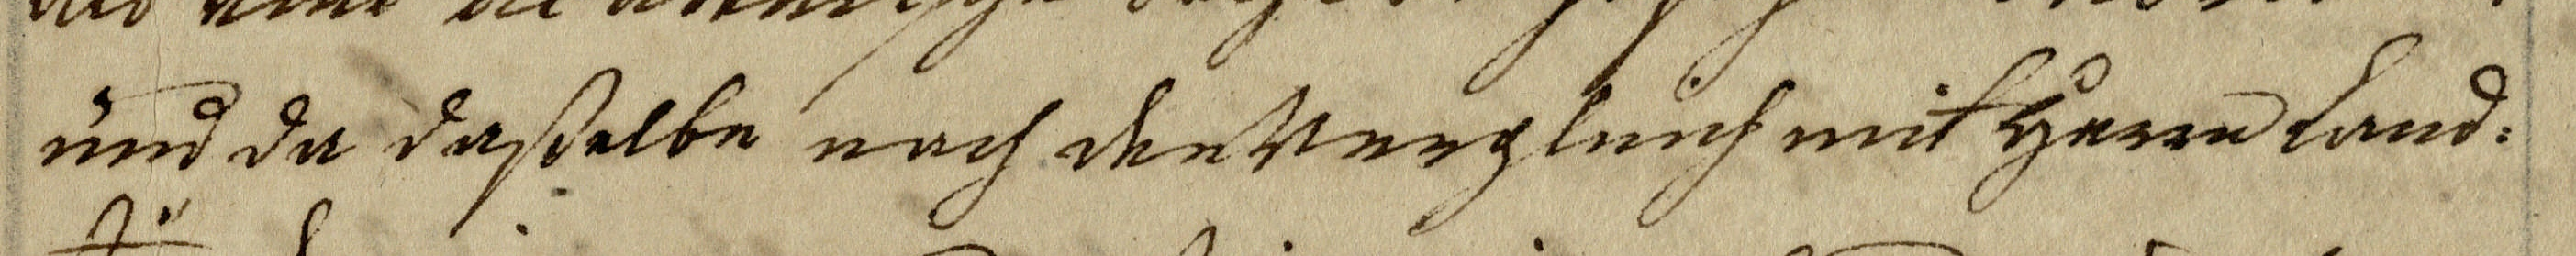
und da daßelbe nach den Vergleich mit Herrn Land¬
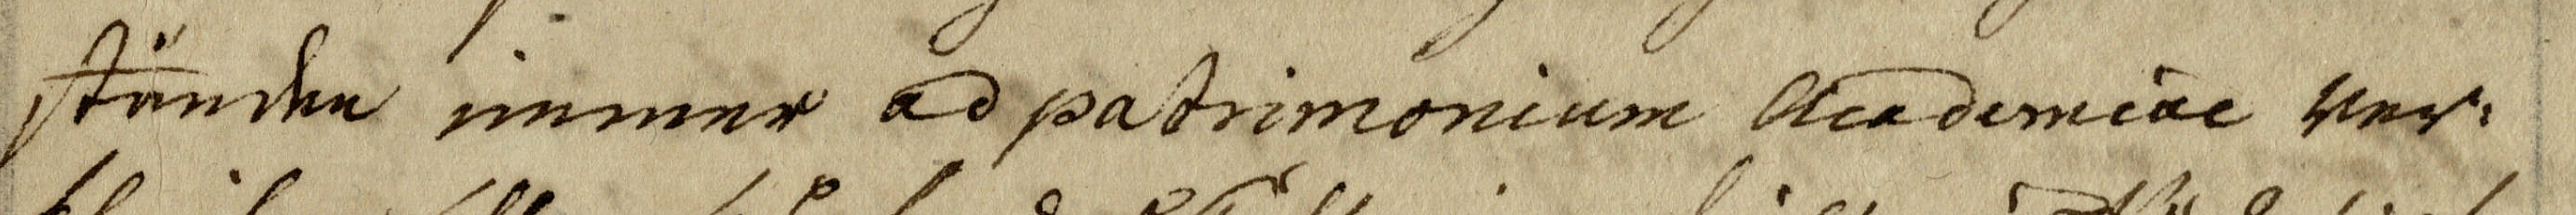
ständen immer ad patrimonium Academiae ver¬
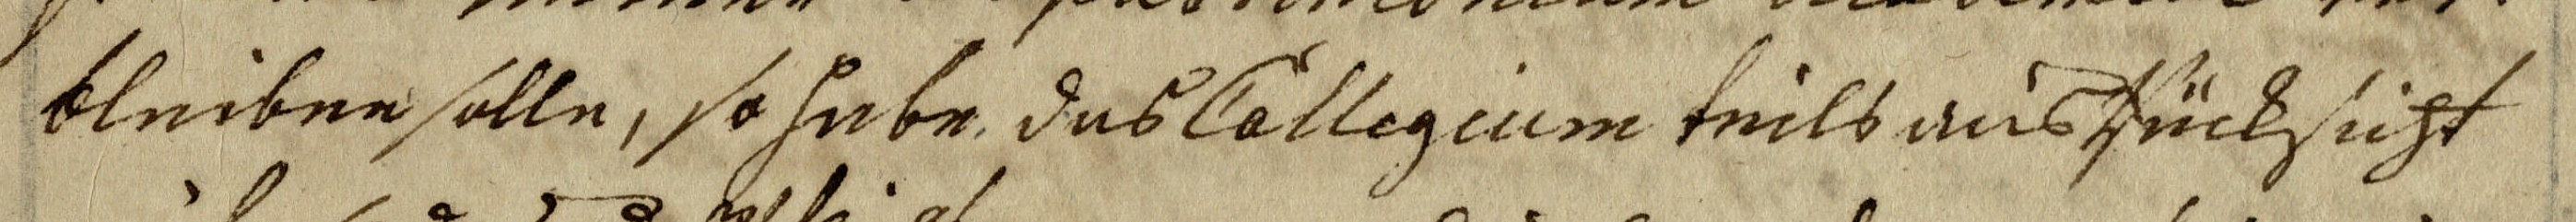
bleiben solle, so habe das Collegium teils aus Rücksicht
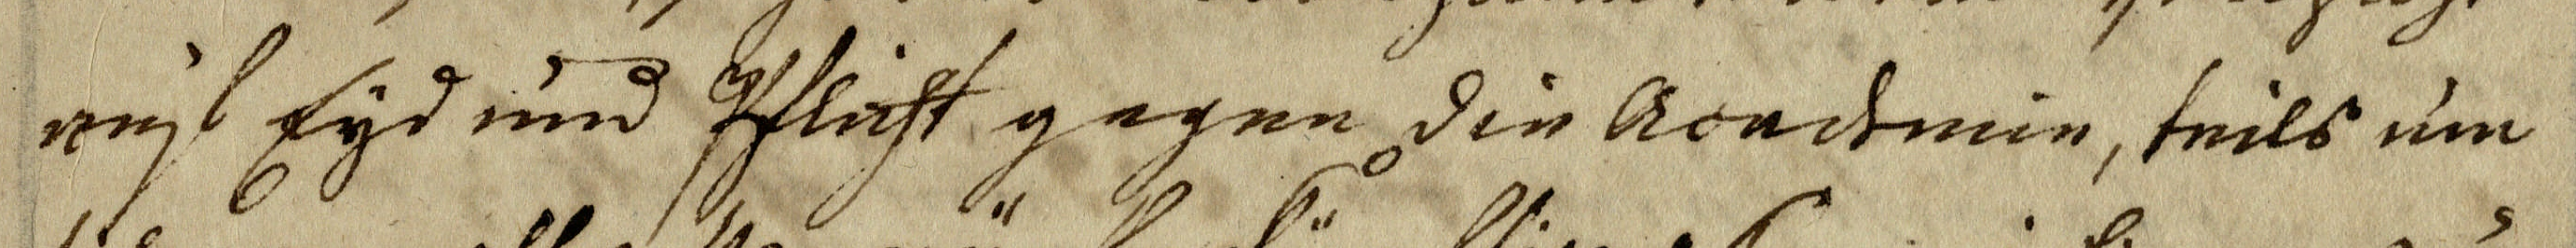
auf Eÿd und Pflicht gegen die Academie, teils um
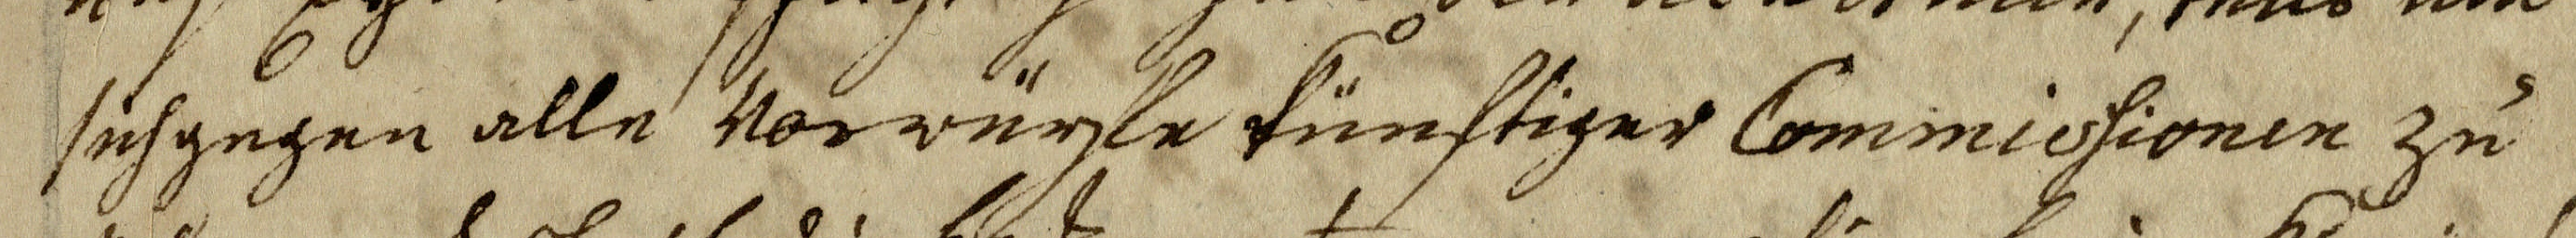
sich gegen alle Vorwürfe künftiger Commissionen zu
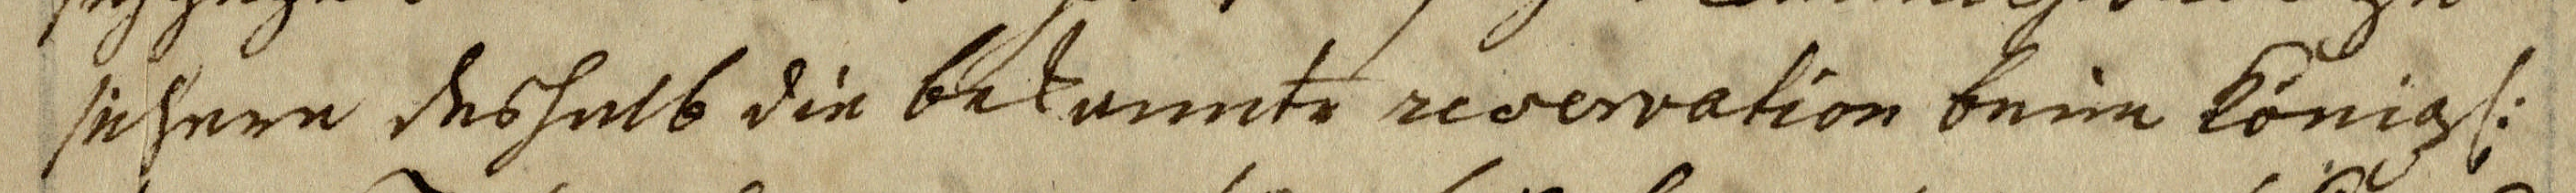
sichern deshalb die bekannte reservation beim Königl.
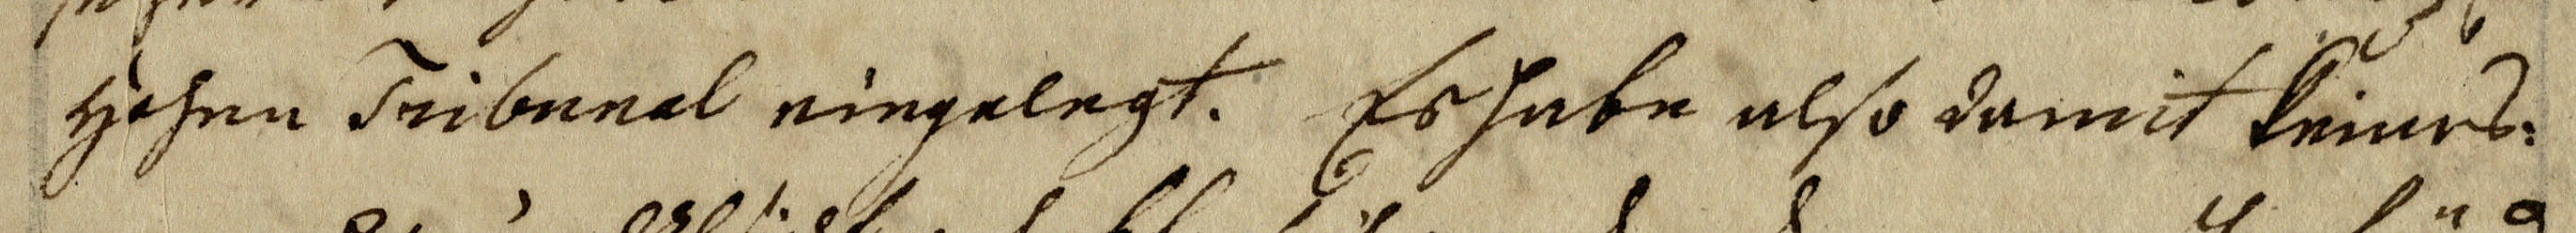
Hohen Tribunal eingelegt. Es habe also damit keines¬
